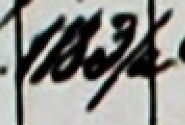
1183/?
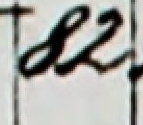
82
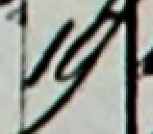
19
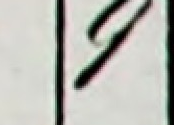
9
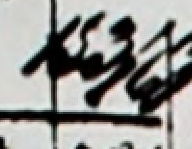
153/6
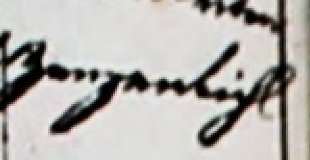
Zengentichl
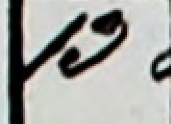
13
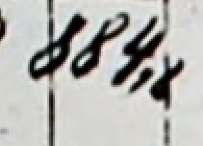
884,8
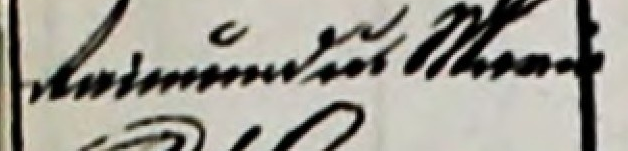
Raimund u. Maria
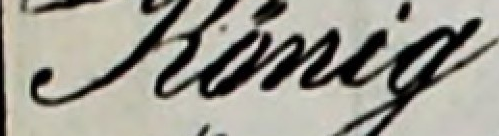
König
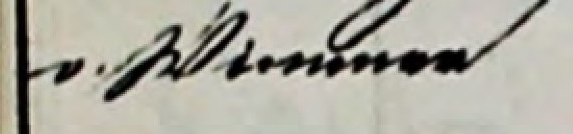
v. Wimmer
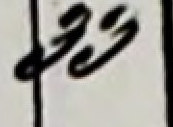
33
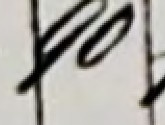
90
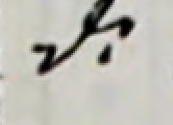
Do
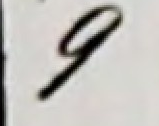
9
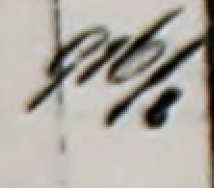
916/b
